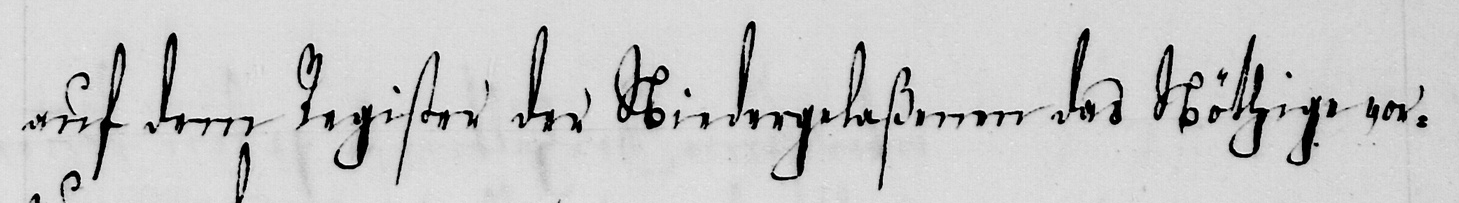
auf dem Register der Niedergelaßenen das Nöthige vor¬
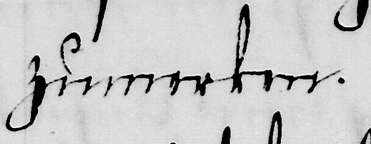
zumerken.
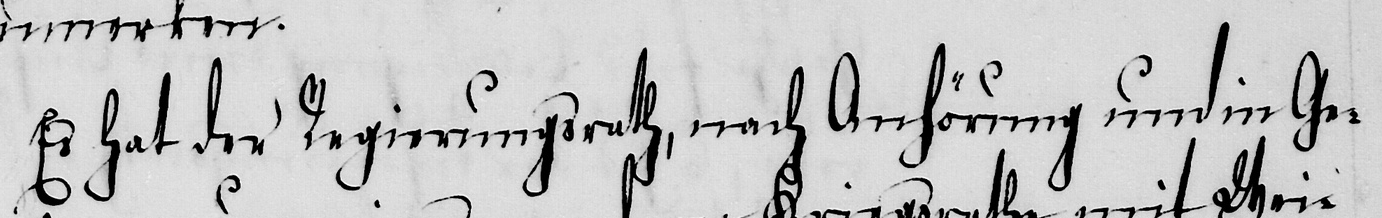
Es hat der Regierungsrath, nach Anhörung und in Ge¬
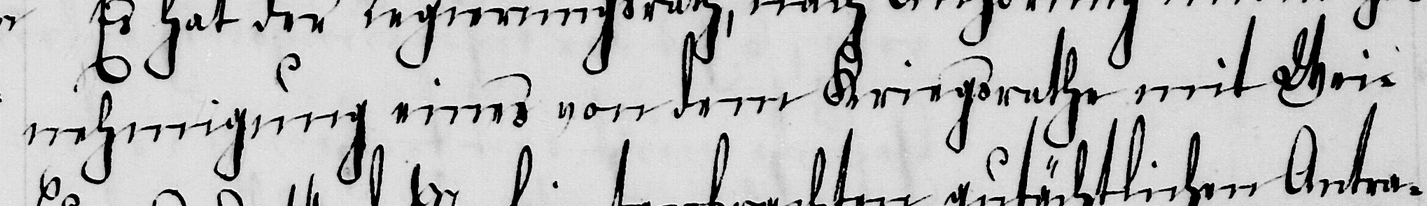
nehmigung eines von dem Kriegsrathe mit Wei¬
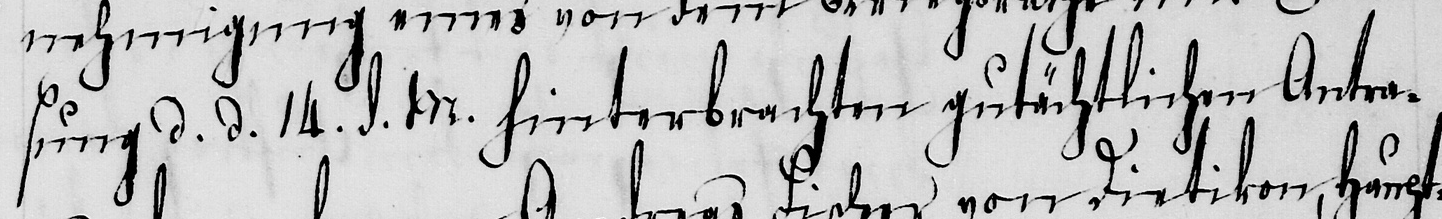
sung d. d. 14. d. M. hinterbrachten gutächtlichen Antra¬
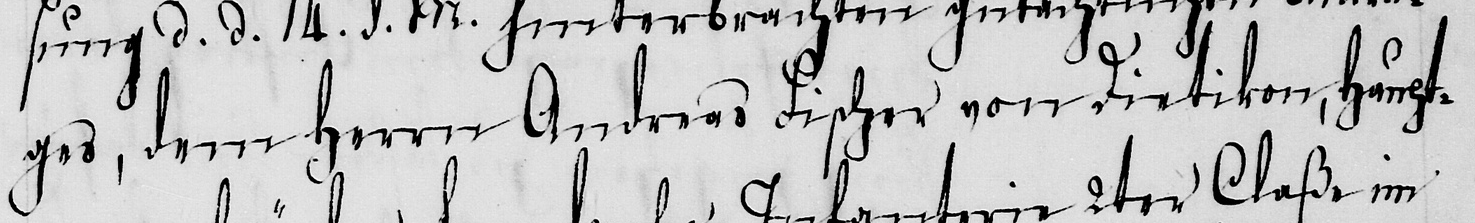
ges, dem Herrn Andreas Fischer von Dietikon, Haupt¬
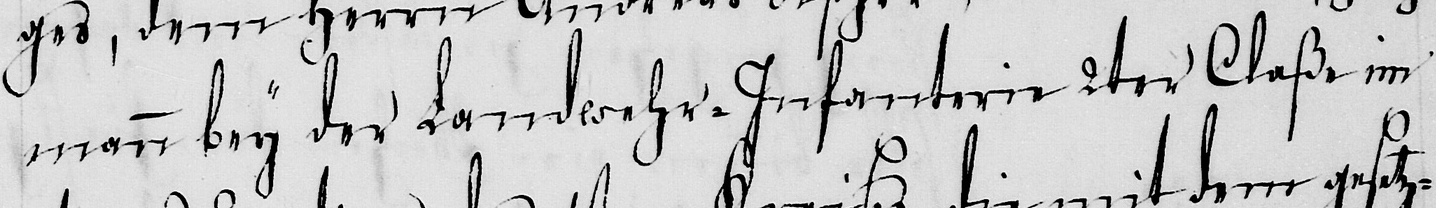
mann bey der Landwehr-Infanterie 2ter Claße im
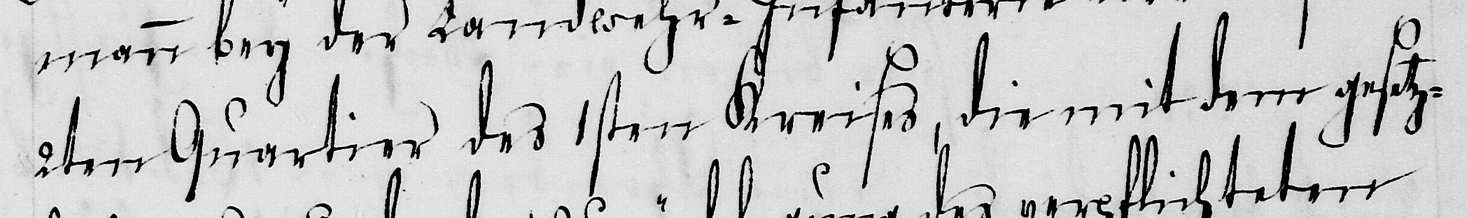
2ten Quartier des 1sten Kreises, die mit dem gesetz¬
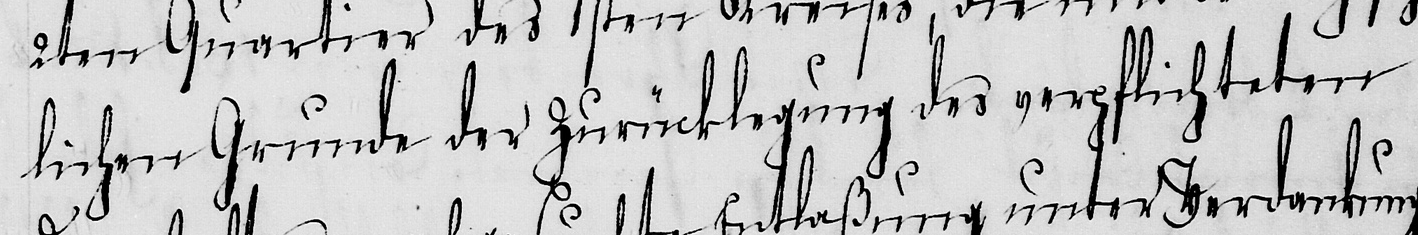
lichen Grunde der Zurücklegung des verpflichteten
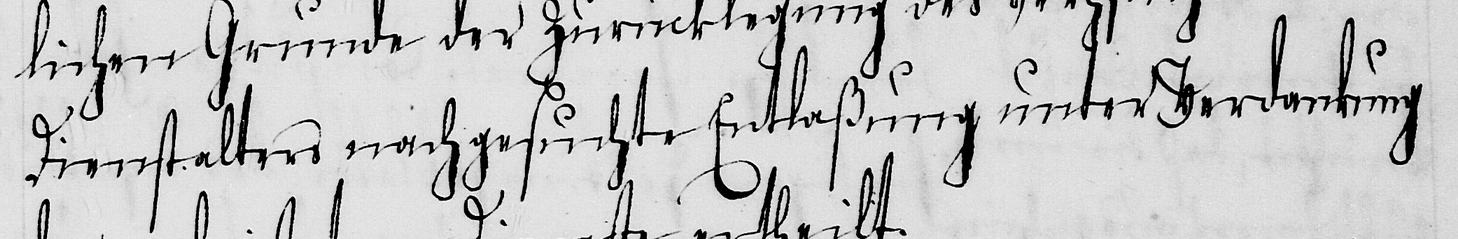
Dienstalters nachgesuchte Entlaßung unter Verdankung
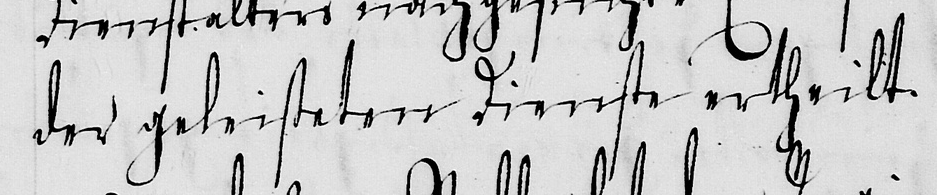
der geleisteten Dienste ertheilt.
